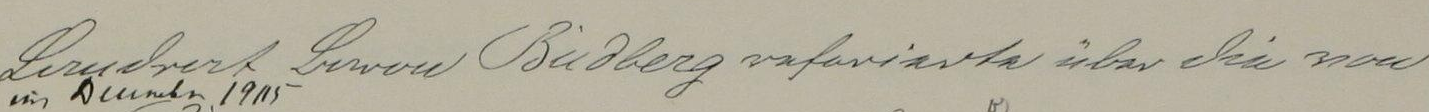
1. Landrat Baron Budberg referierte über die von
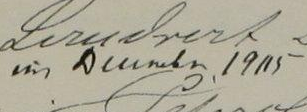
im December 1905
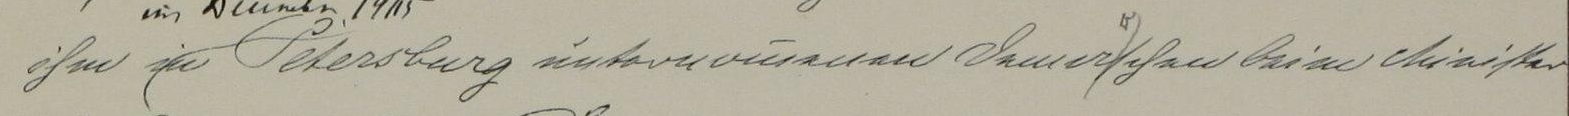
ihm in Petersburg unternommenen Demarschen beim Minister
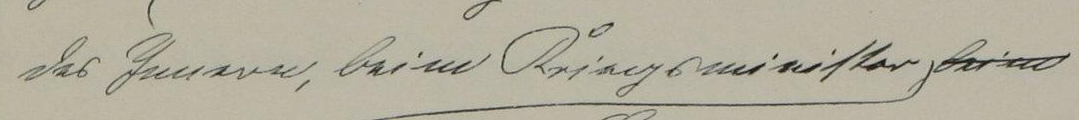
des Innern, beim Kriegsminister, beim
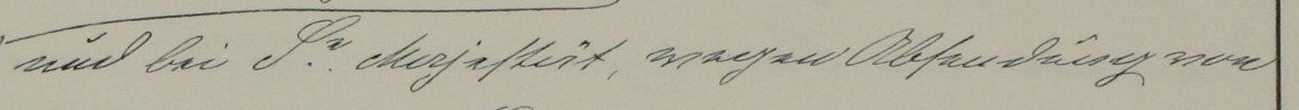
und bei Sr. Majestät, wegen Absendung von
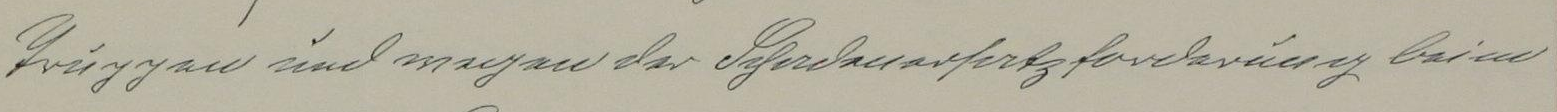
Truppen, und wegen der Schadenersatzforderung beim
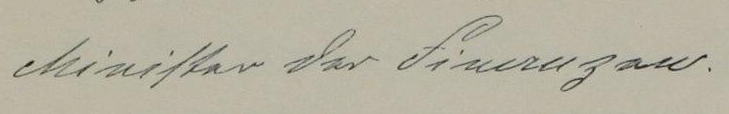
Minister der Finanzen.
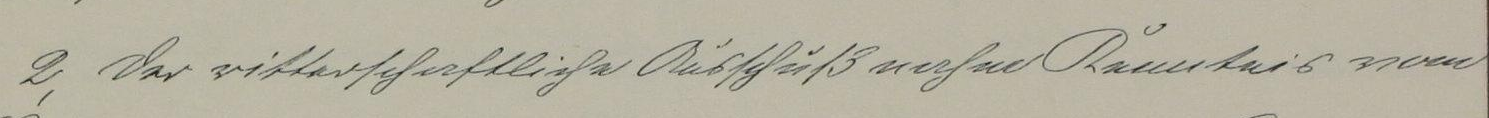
2. Der ritterschaftliche Ausschuß nahm Kenntnis vom
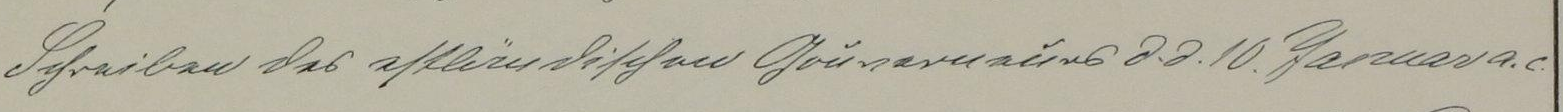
Schreiben des estländischen Gouverneurs d.d. 10. Januar a.c.
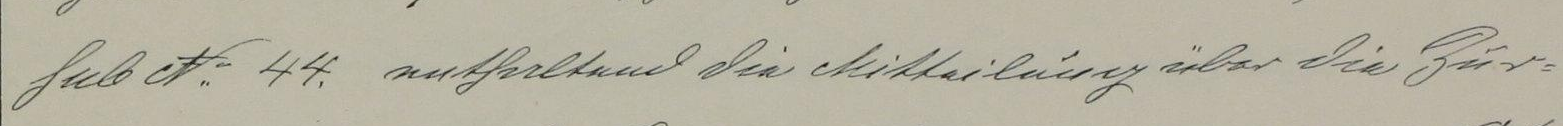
sub No.44. enthaltend die Mitteilung über die Zur-
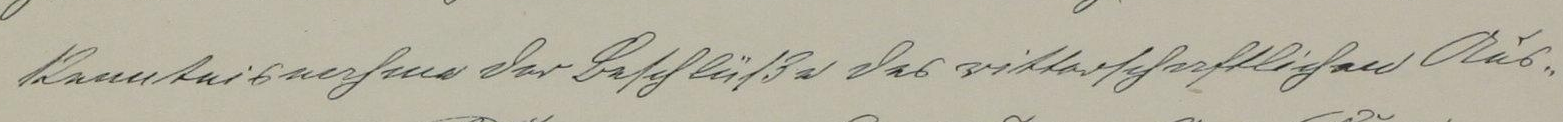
kenntnisnahme der Beschlüße des Ritterschaftlichen Aus-
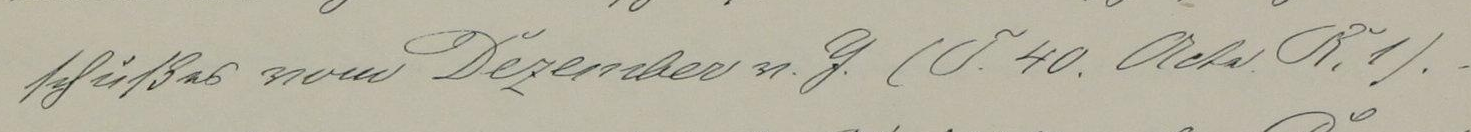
schußes vom Dezember v.J. (T.40. Acte R.1).
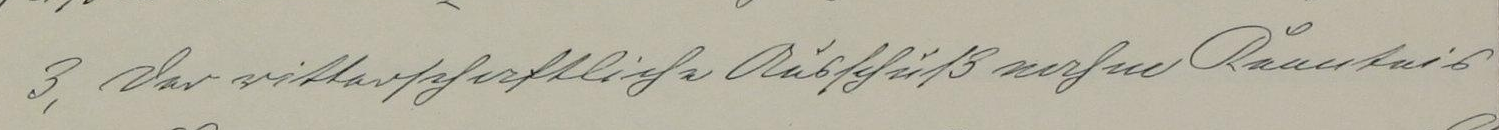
3. Der ritterschaftliche Ausschuß nahm Kenntnis
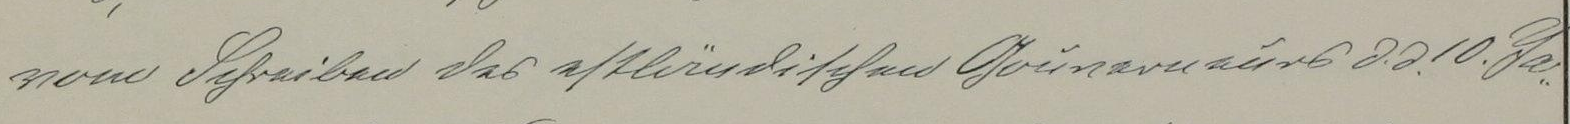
vom Schreiben des estländischen Gouverneurs d.d. 10. Ja-
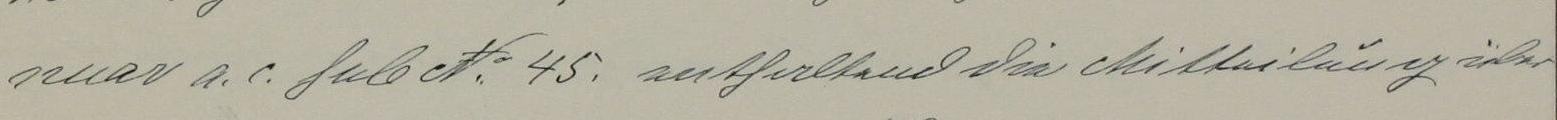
nuar a.c. sub No.45 enthaltend die Mitteilung über
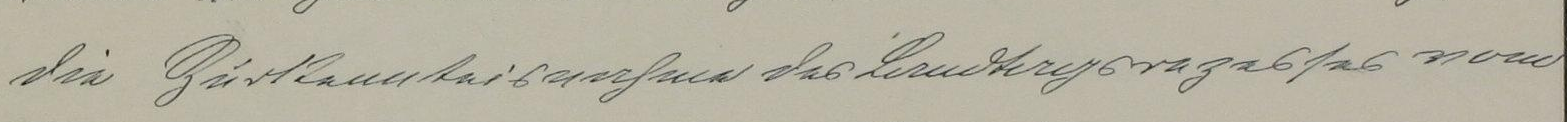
die Zurkenntnisnahme des Landtagsrezesses vom
